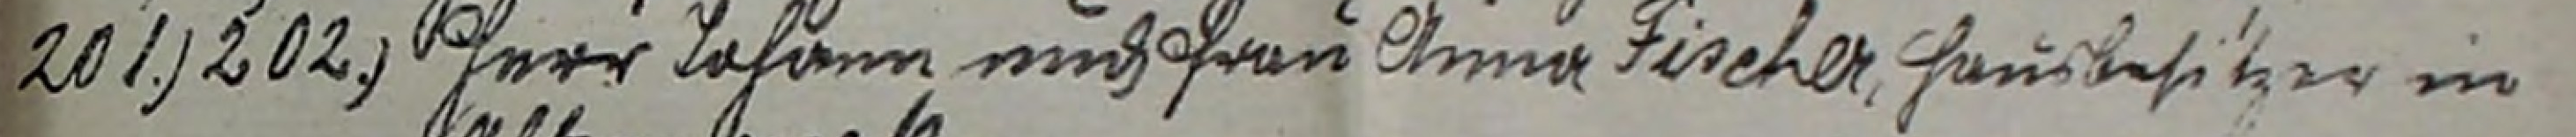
201.) 202.) Herr Johann und Frau Anna Fischer, Hausbesitzer in
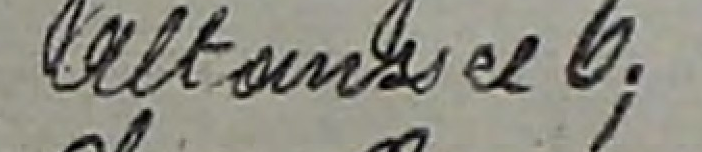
Altaussee 6;
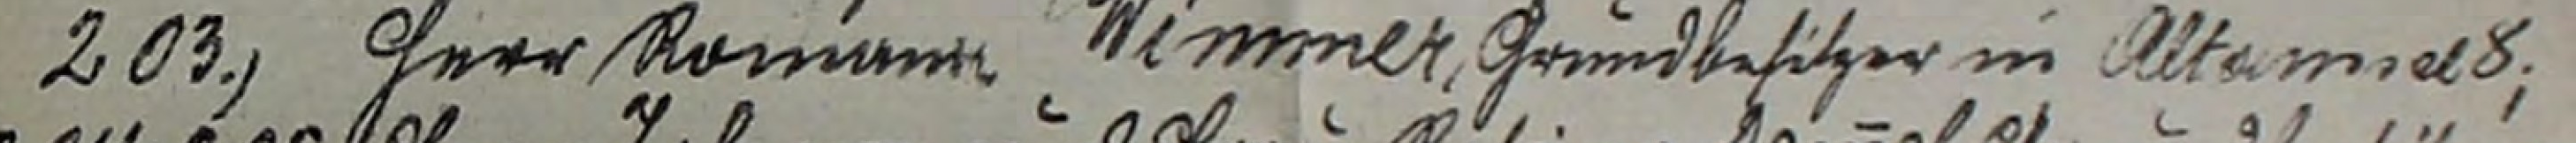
203.) Herr Roman Wimmer, Grundbesitzer in Altaussee 8;
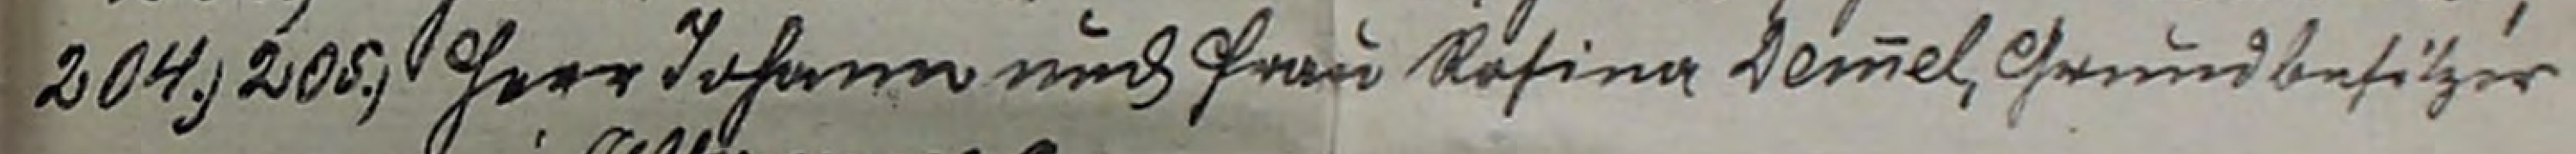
204.) 205.) Herr Johann und Frau Rosina Demmel, Grundbesitzer
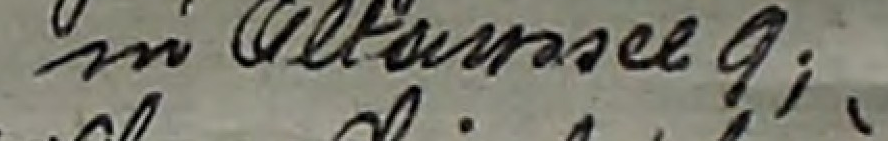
in Altaussee 9;
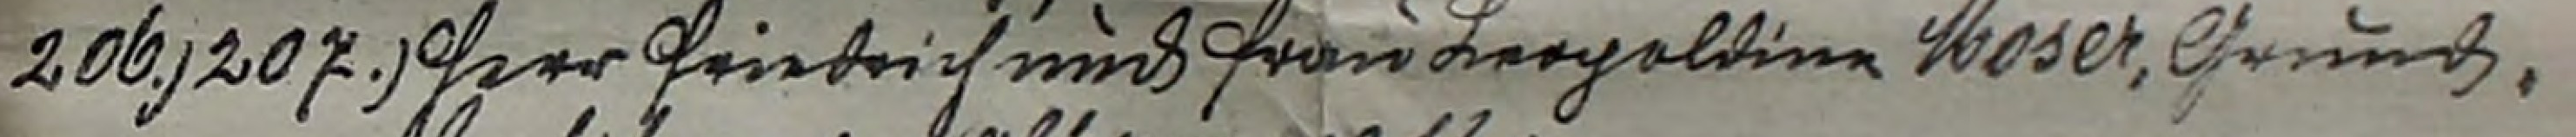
206.) 207.) Herr Friedrich und Frau Leopoldine Moser, Grund„
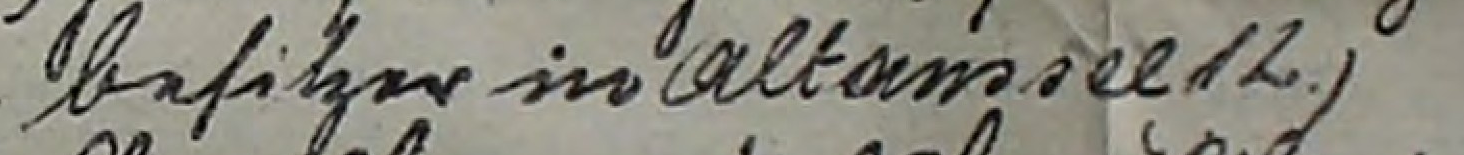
besitzer in Altaussee 12;
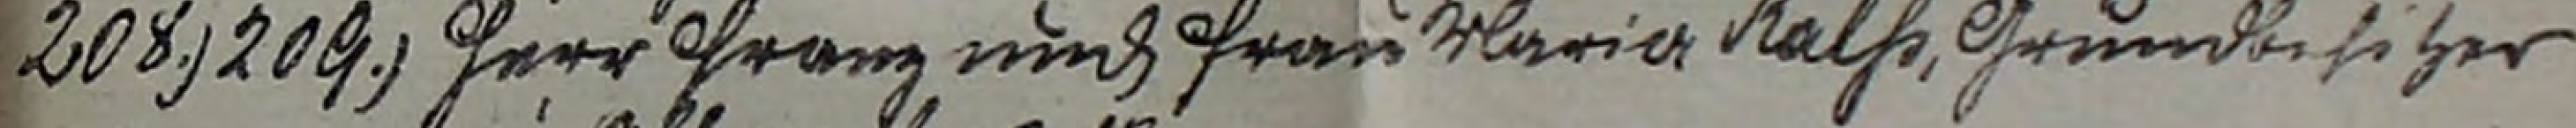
208.) 209.) Herr Franz und Frau Maria Kalhs, Grundbesitzer
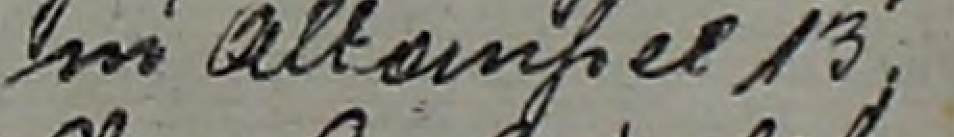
in Altaussee 13;
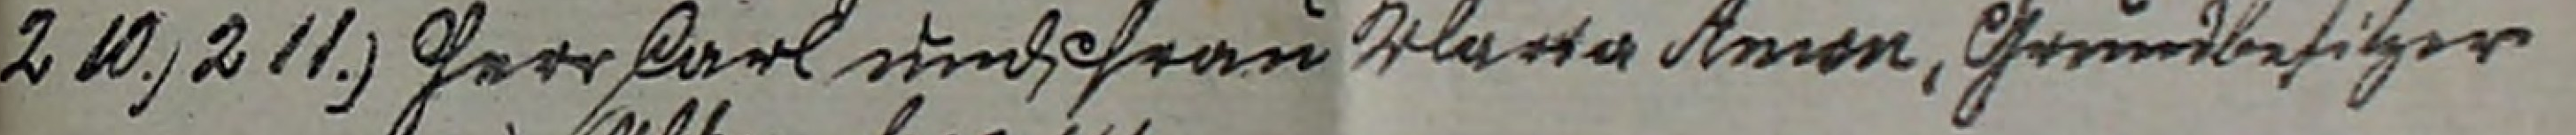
210.) 211.) Herr Carl und Frau Maria Amon, Grundbesitzer
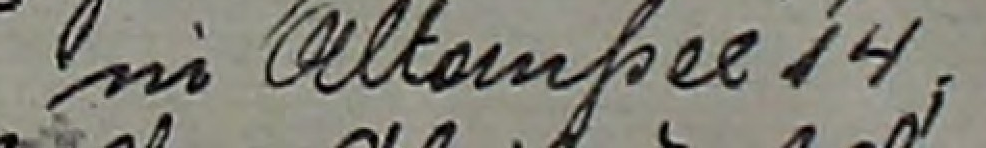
in Altaussee 14;
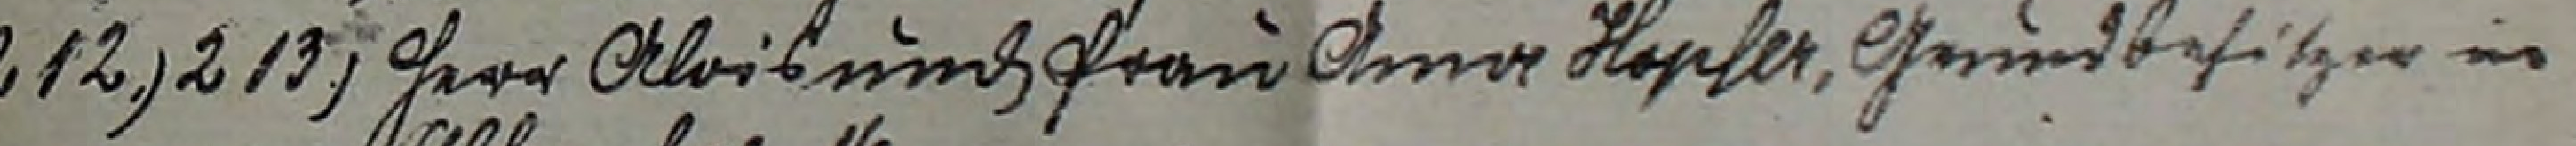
212.) 213.) Herr Alois und Frau Anna Hopfer, Grundbesitzer in
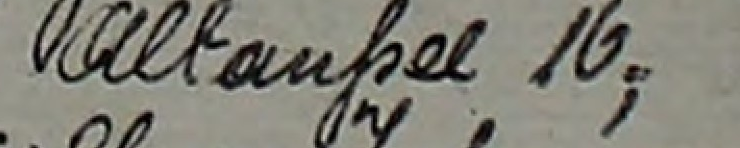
Altaussee 16;
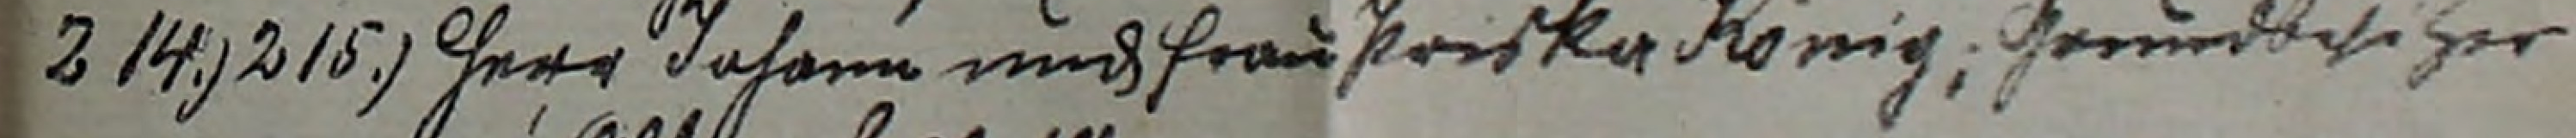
214.) 215.) Herr Johann und Frau Priska König, Grundbesitzer
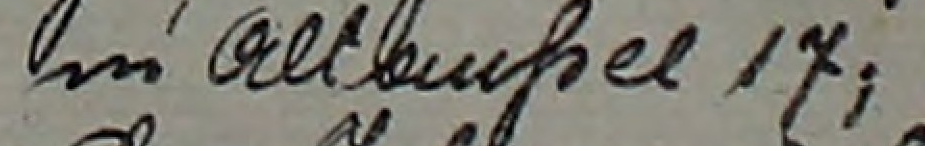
in Altaussee 17;
